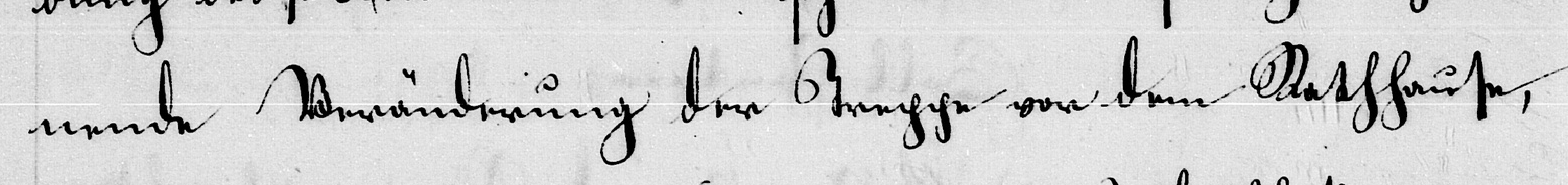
nende Veränderung der Treppe vor dem Rathhause,
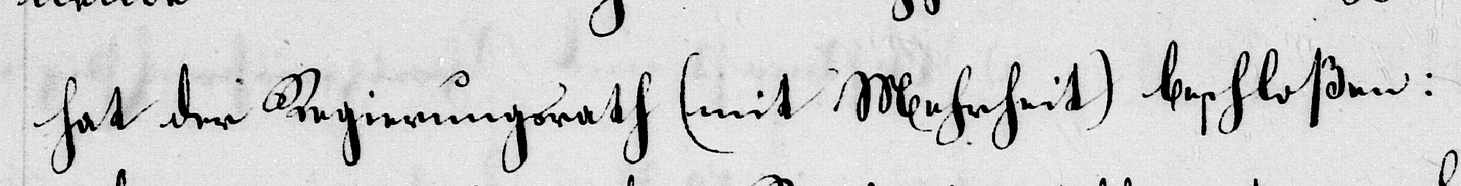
hat der Regierungsrath (mit Mehrheit) beschloßen:
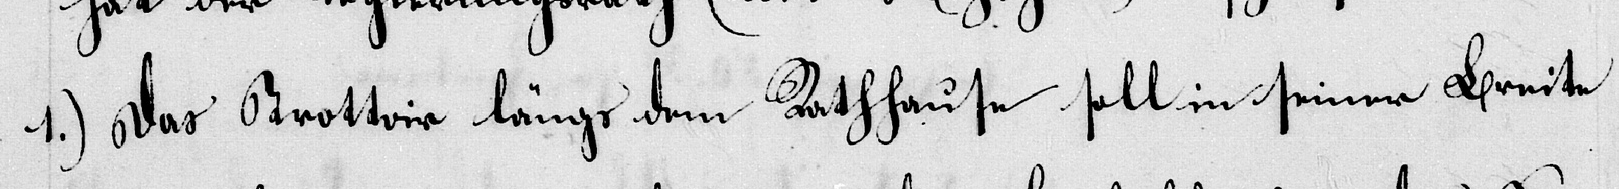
1.) Das Trottoir längs dem Rathause soll in seiner Weite
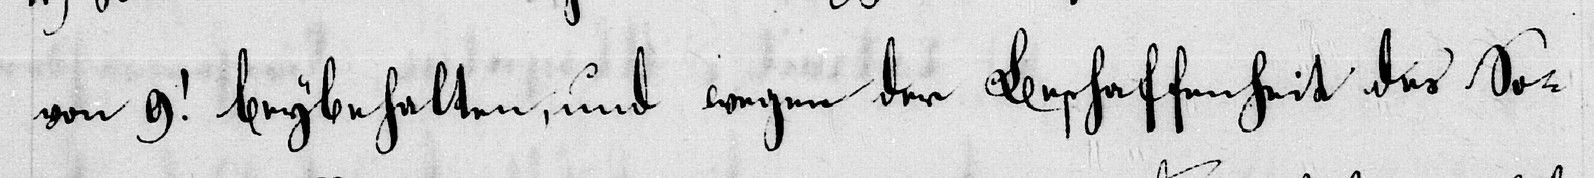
von 9.’ beybehalten, und wegen der Beschaffenheit des So¬
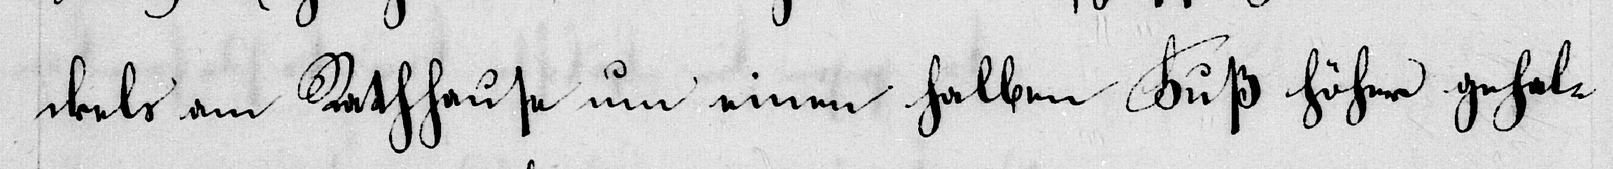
ckels am Rathhause um einen halben Fuß höher gehal¬
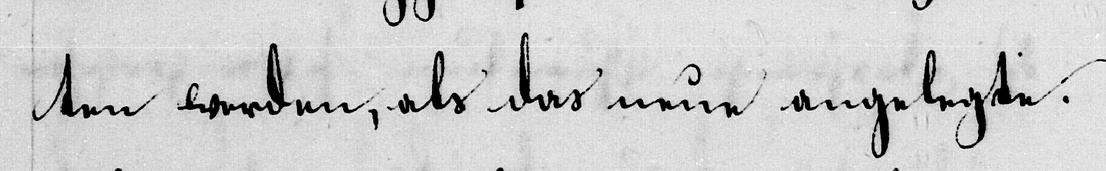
ten werden, als das neue angelegte.
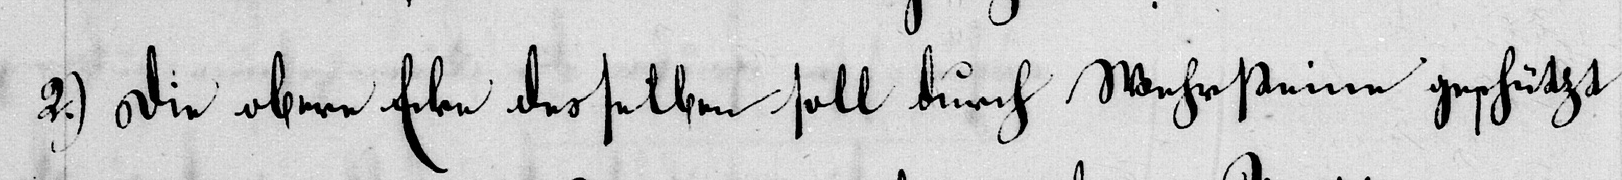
2.) Die obere Ecke desselben soll durch Mehrsteine geschützt
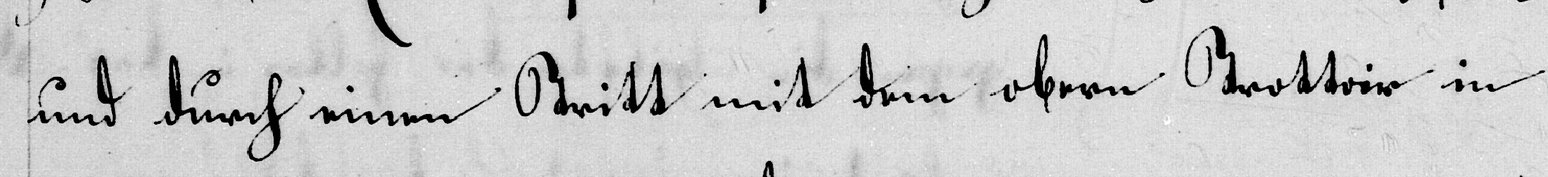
und durch einen Tritt mit dem obern Trottoir in
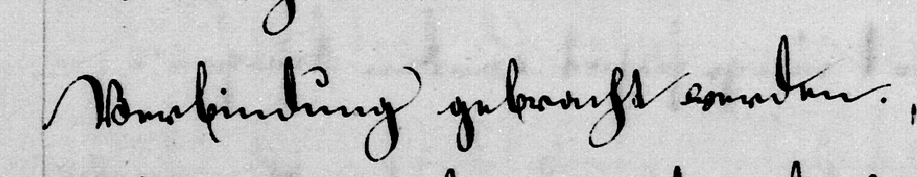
Verbindung gebracht werden.
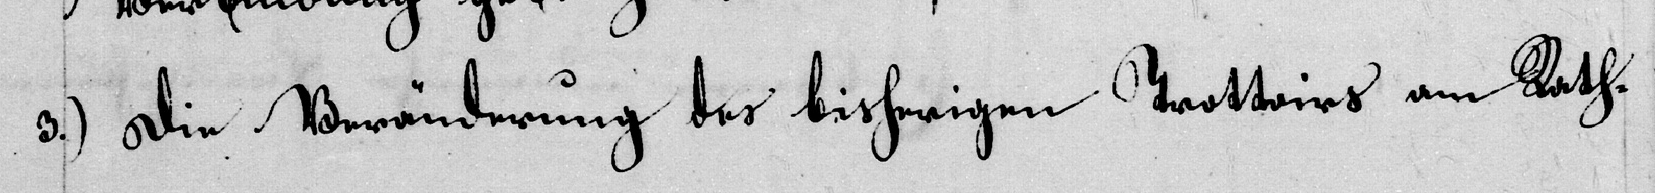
3.) Die Veränderung des bisherigen Trottoirs am Rath-
